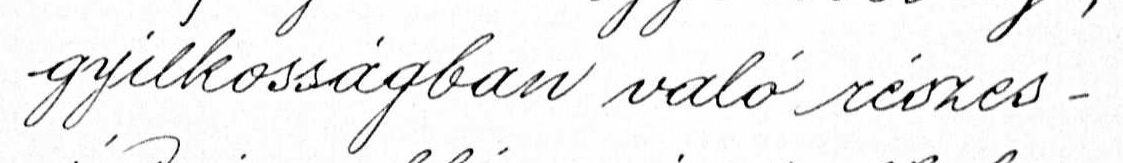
gyilkosságban való részes¬
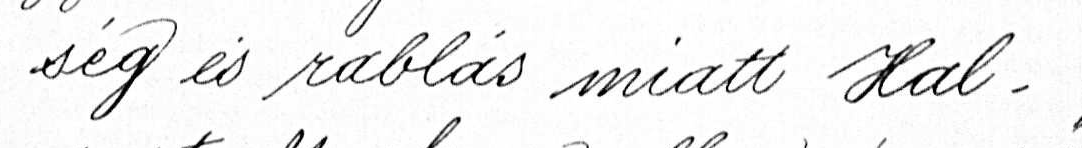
ség es rablás miatt Hal¬
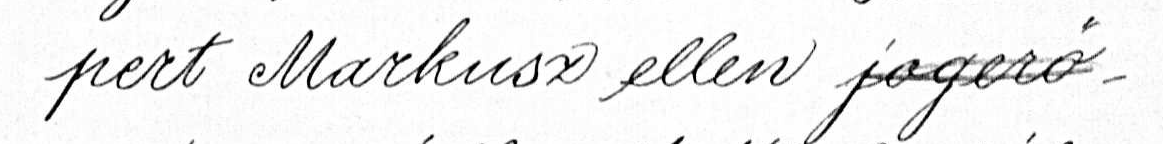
pert Markusz ellen
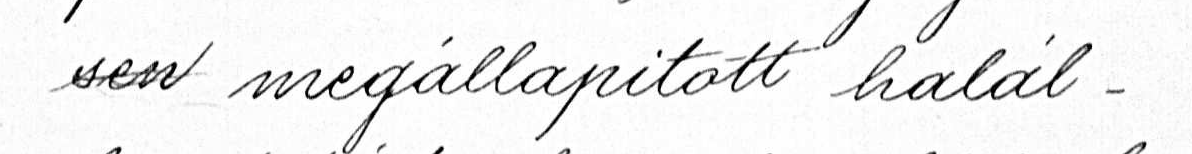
megállapitott halál¬
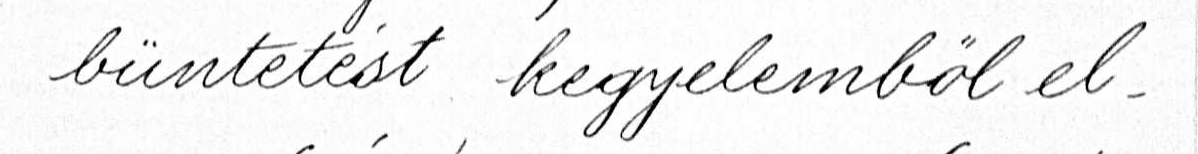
büntetést hegyelemböl el¬
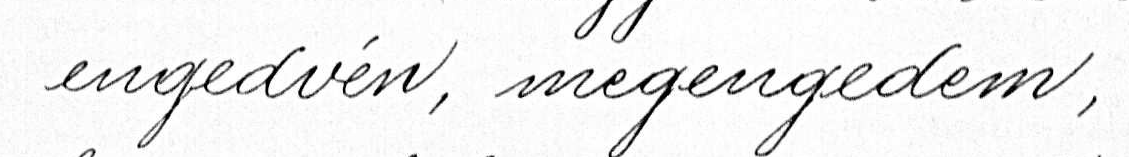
engedvén, megengedem,
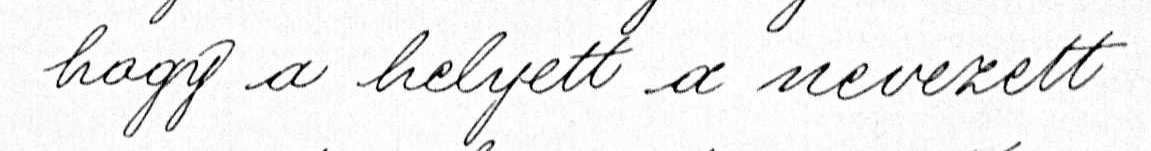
hagy a helyett a nevezett
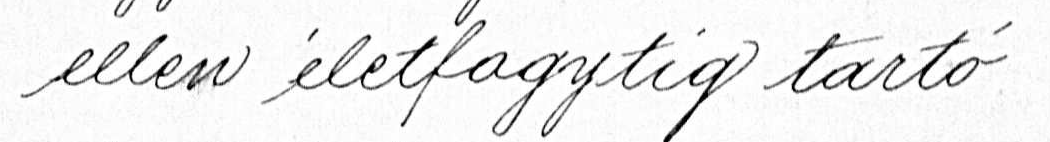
ellen életfagytig tartó
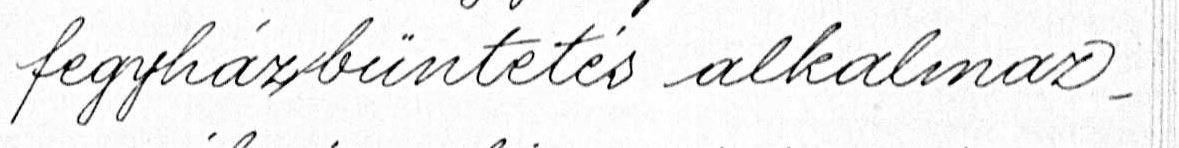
fegyházbüntetés alkalmaz¬
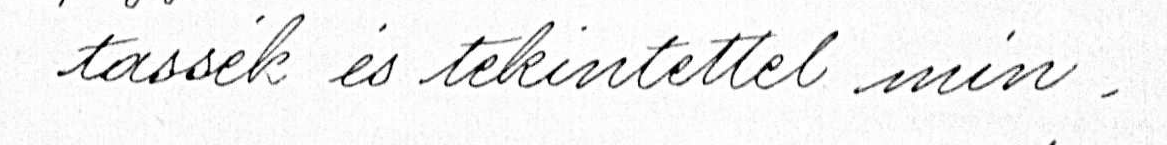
tassék és tekintettel min¬
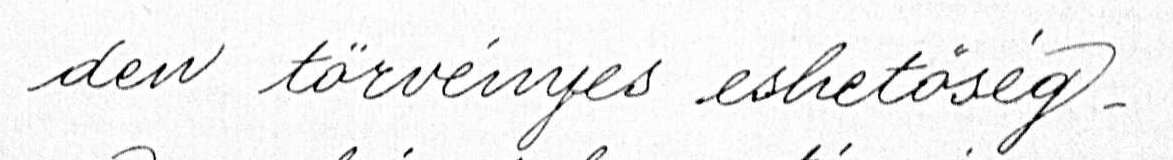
den törvényes eshetöség¬
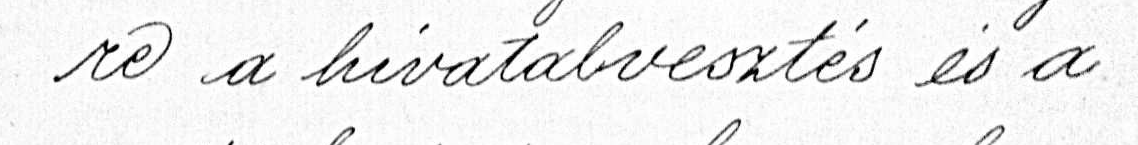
re a hivatalvesztés és a
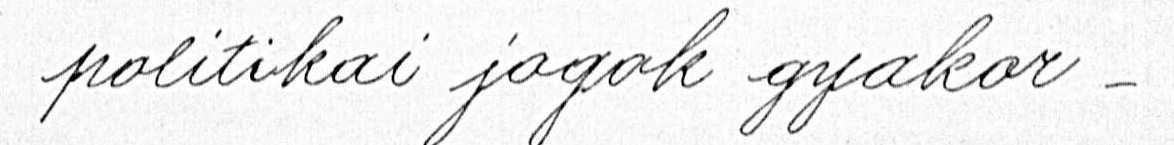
politikai jogok gyakor-
